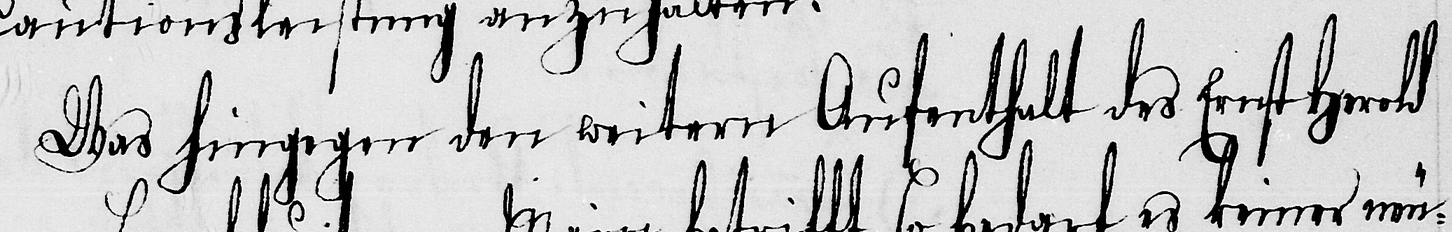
Was hingegen den weitern Aufenthalt des Ernst
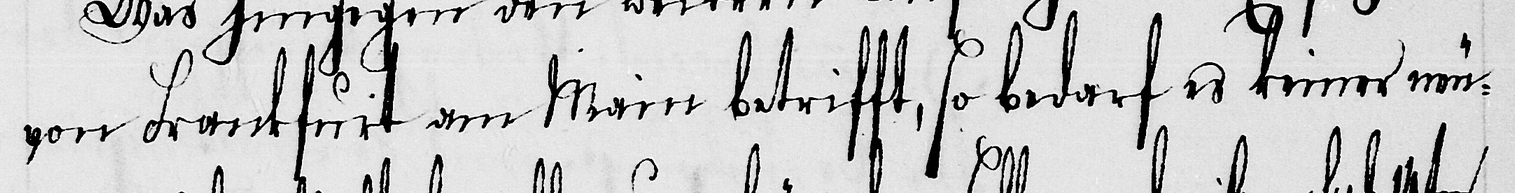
von Frankfurt am Main betrifft, so bedarf es keiner neu¬
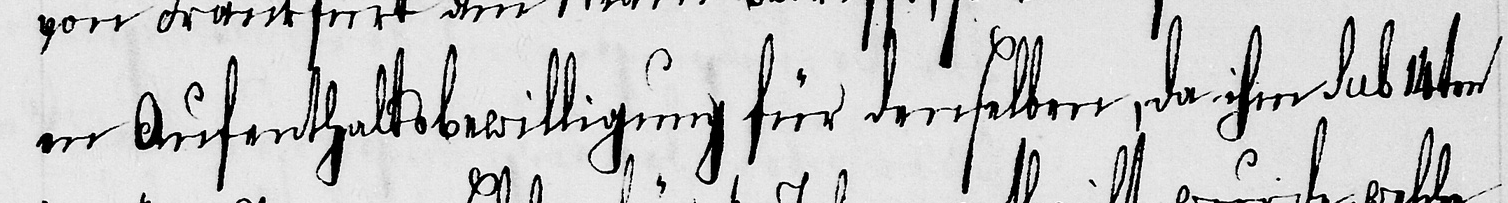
en Aufenthaltsbewilligung für denselben, da ihm sub 14ten
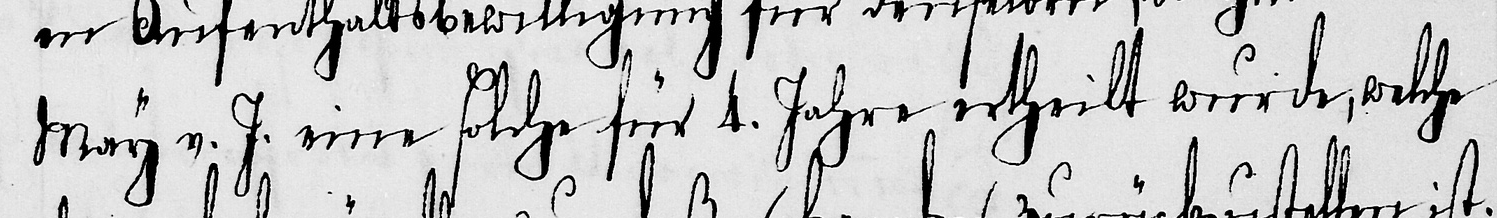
Mey v. J. eine solche für 4. Jahre ertheilt wurde, welche
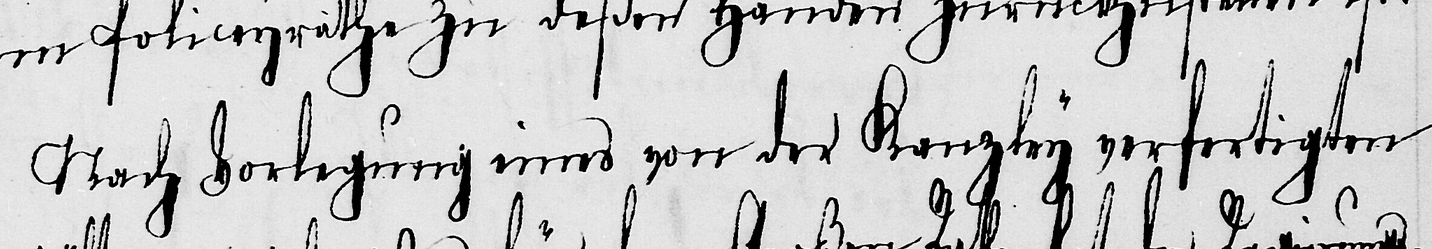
Nach Vorlegung eines von der Kanzley verfertigten
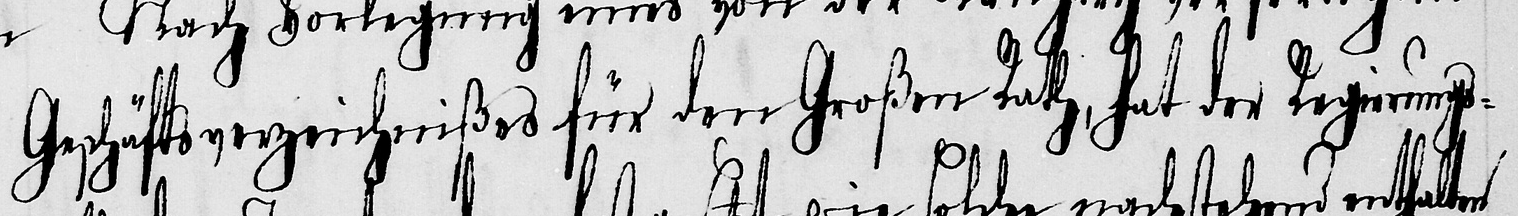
Geschäftsverzeichnißes für den Großen Rath, hat der Regierung¬
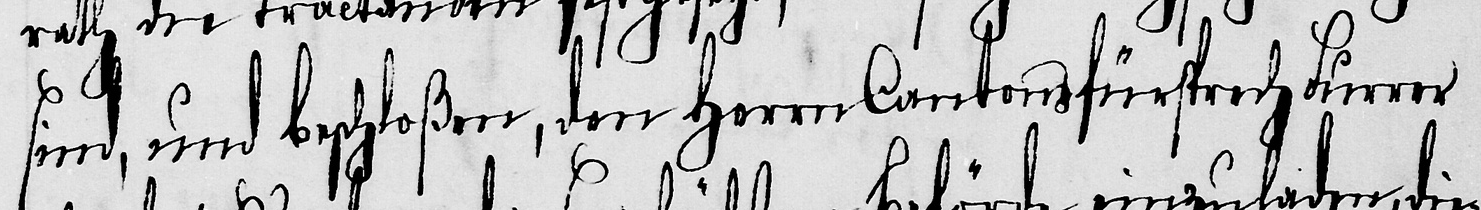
sind, und beschloßen, den Herrn Cantonsfürsprech Furrer
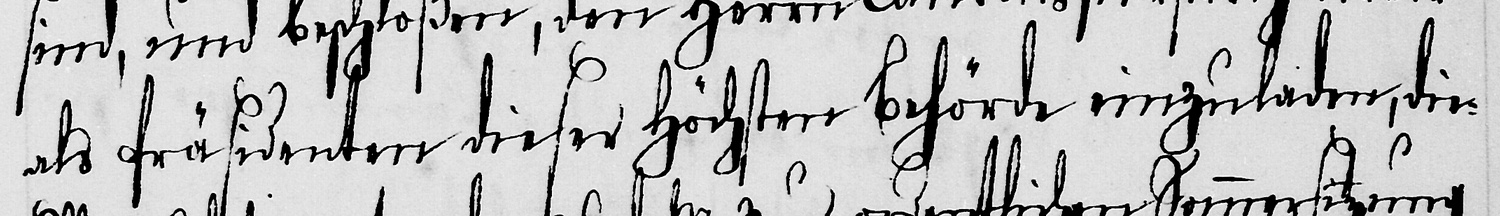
als Präsidenten dieser höchsten Behörde einzuladen, die¬
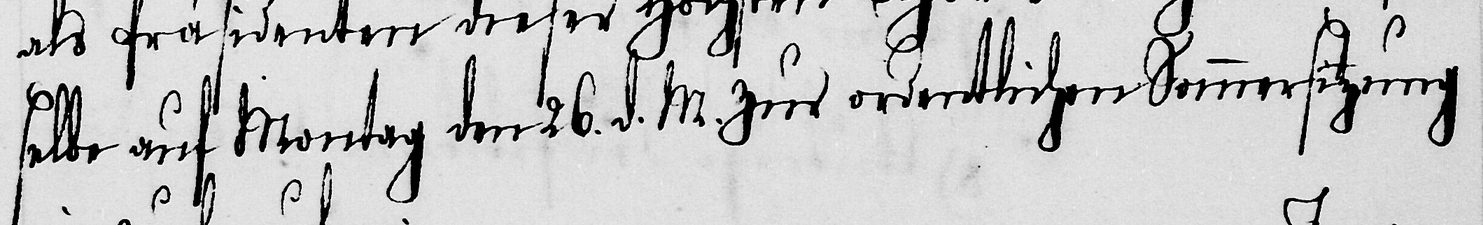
selbe auf Montag den 26. d. M. zur ordentlichen Sommersitzung
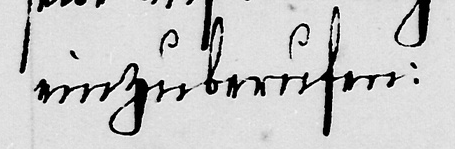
einzuberufen:
